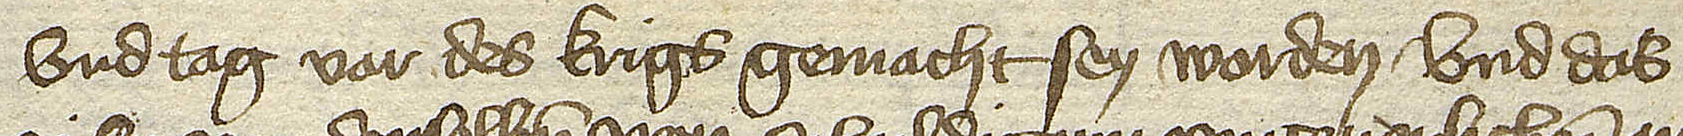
vnd tag vor des krigs gemacht ſey worden / vnd das
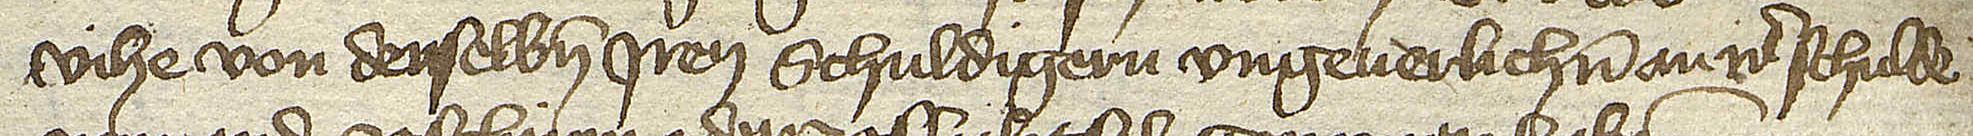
vihe von denſelbn* Iren Schuldigern vngeuerlichn* an ir* ſchulde
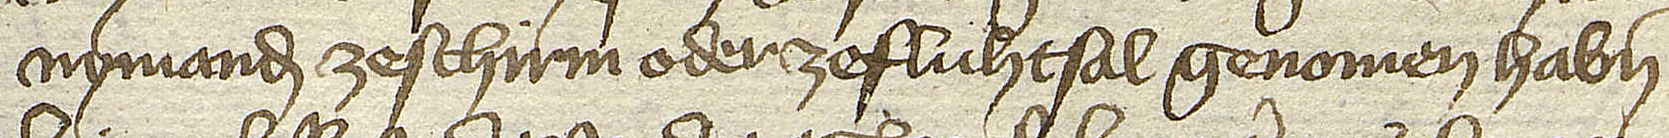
nymand* cʒeſchirm oder cʒefluht ſal genomen habn*
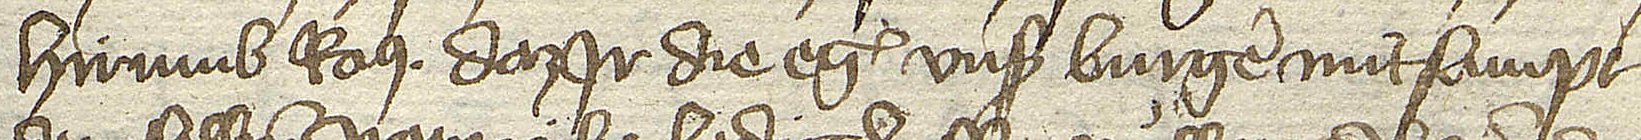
hirumb Ro* . daʒ Ir die eg* vnſ* burge* mit ſampt
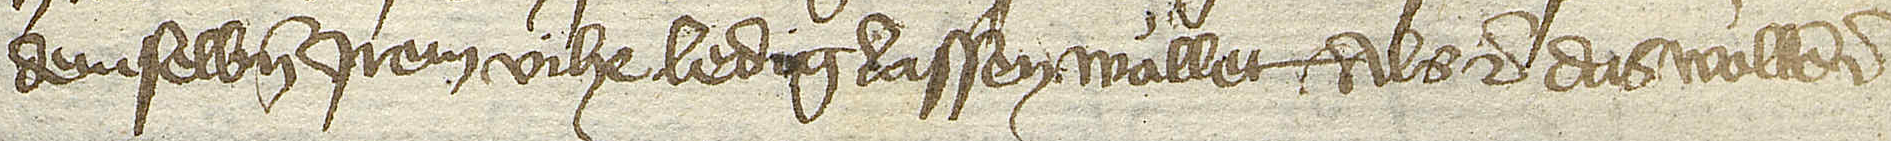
demſelbn* Irem vihe ledig laſſen wöllet / Als ec* das wölle* ec*
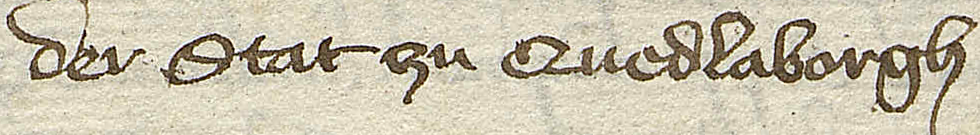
Der Stat cʒu Quedlaborgh
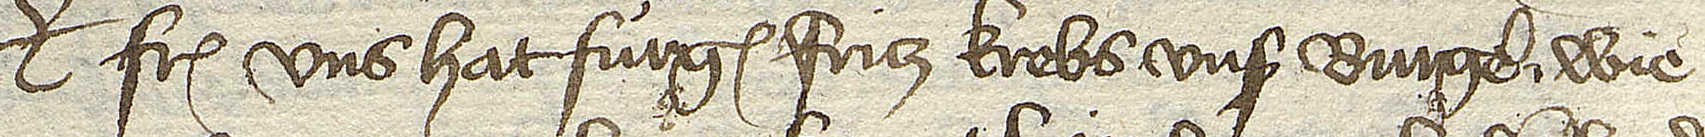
L* fr* vns hat fürg* Fricʒ krebs vnſ* Burge* . wie
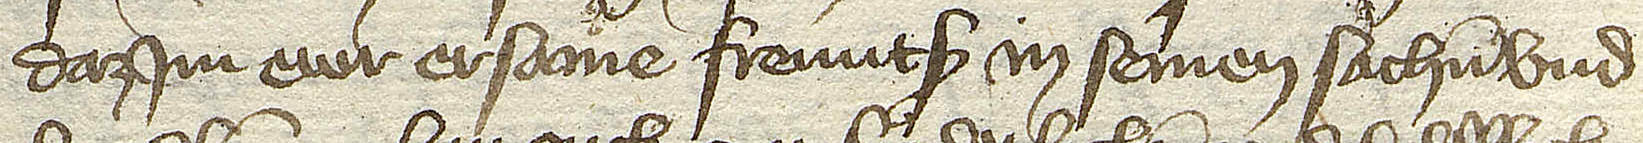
daʒ Im ewr erſame freuntſ* in ſeinen ſachn* vnd
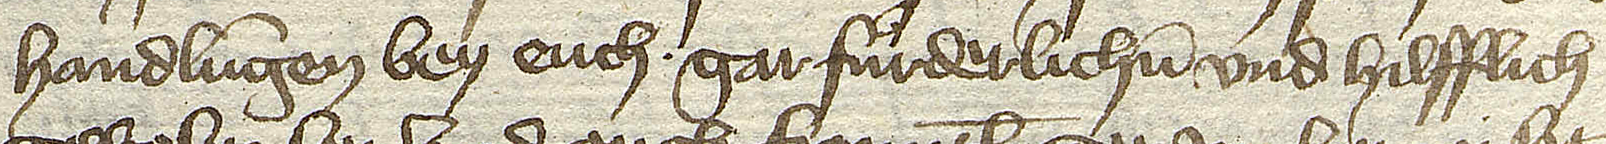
handlug*en bey euch gar fürderlichn* vnd hilfflich
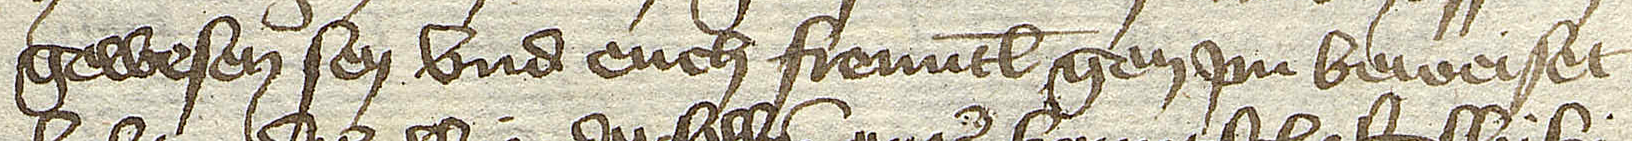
geweſen ſey vnd euch freuntl* gen Im beweiſet
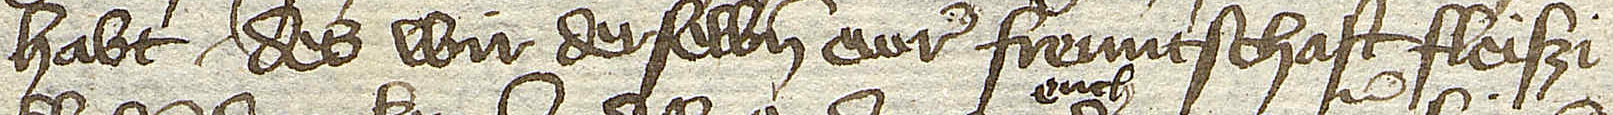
habt / des wir derſelbn* ewr* freuntſchaft fleiſʒi
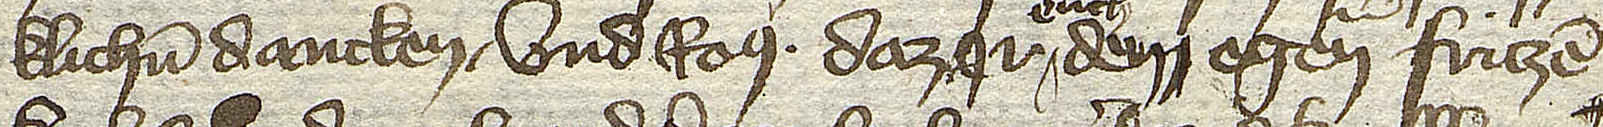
klichn* dancken / vnd Ro* . daʒ Ir den egen* fricʒe*
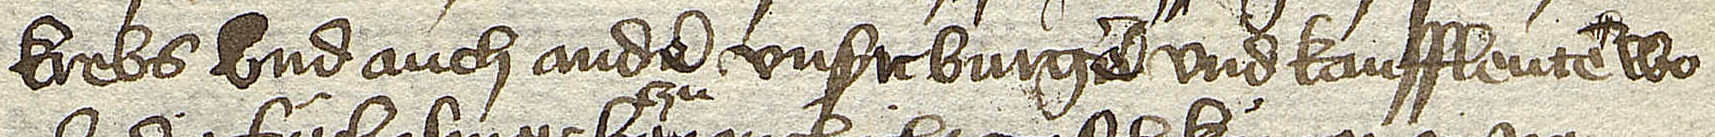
krebs vnd auch ande* vnſ*n burgn* vnd kauffleute* wo
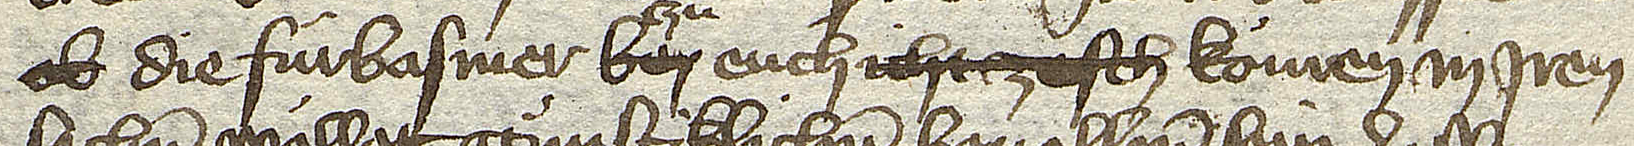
ob die fürbaſ mer bey euch icht cʒeſch kömen in Iren
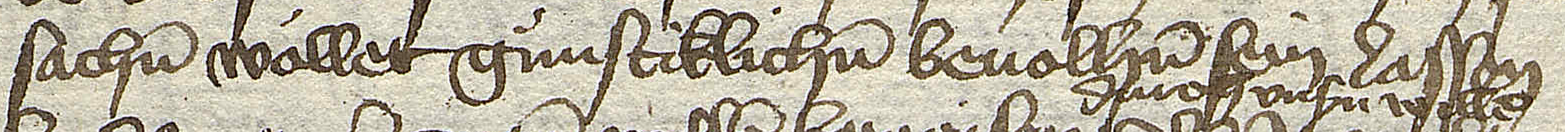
ſachn* wöllet günſtiklichn* beuolhn* ſein laſſen
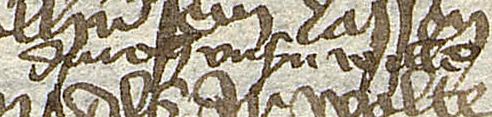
durch vnſ*n wille*
